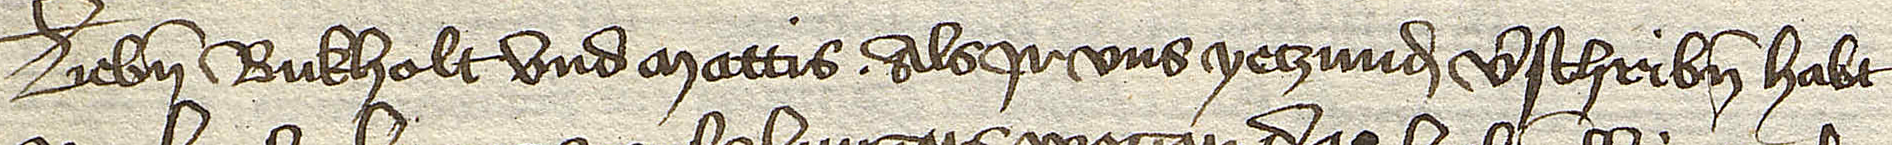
Liebn* Bukholt vnd Mattis . Als Ir vns yecʒund* v*ſchribn* habt
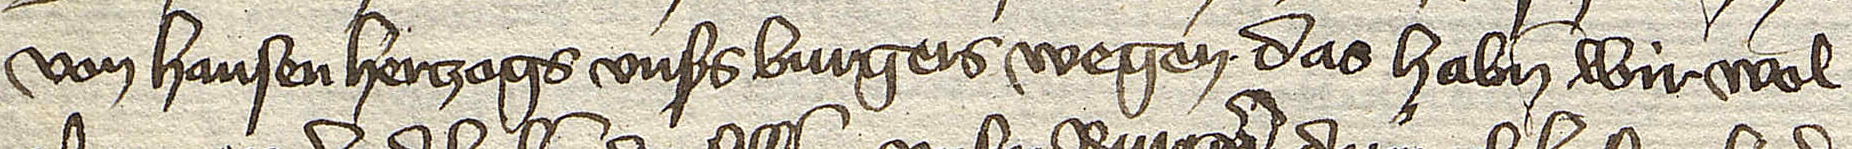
von hanſen hercʒogs vnſ*s burgers wegen . Das habn* wir wol
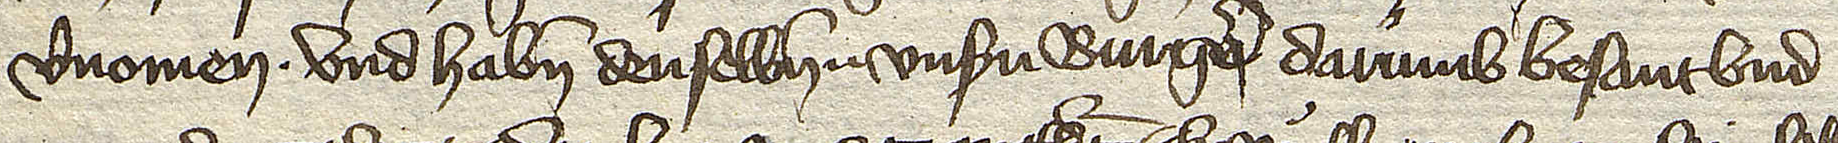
v*nomen . vnd habn* denſelbn* ~ vnſ*n Burge* darümb beſant vnd
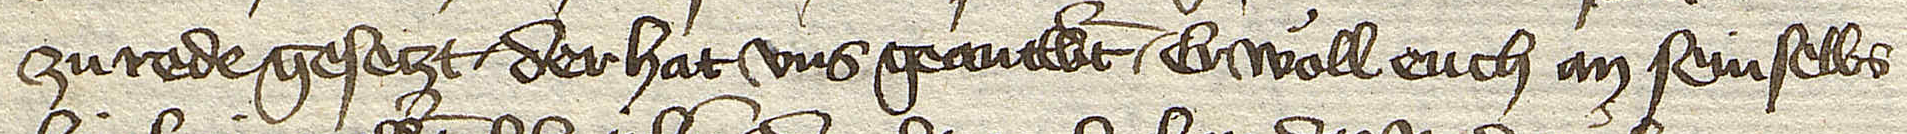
cʒu rede geſecʒt / der hat vns geantw*t / Er wöll euch an ſeinſelbs
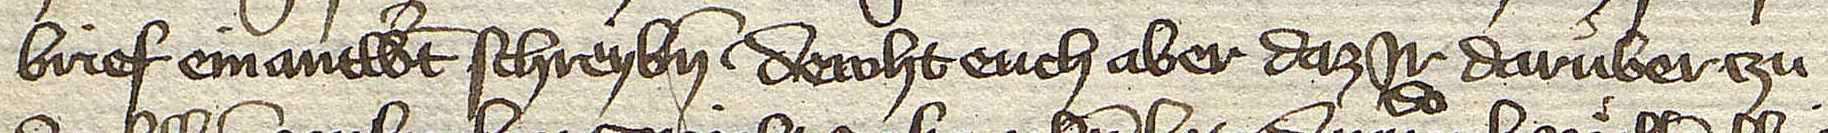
brief ein antw*t ſchreybn* / Dewht euch aber daʒ Ir darüber cʒu
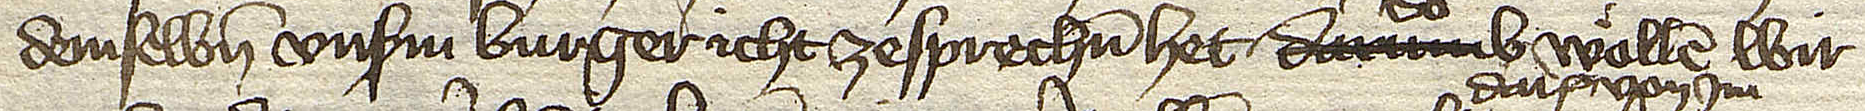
demſelbn* vnſ*m burger icht cʒeſprechn* het / Darumb wölle* wir
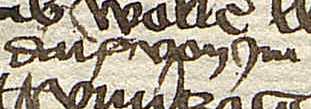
dar* von Im
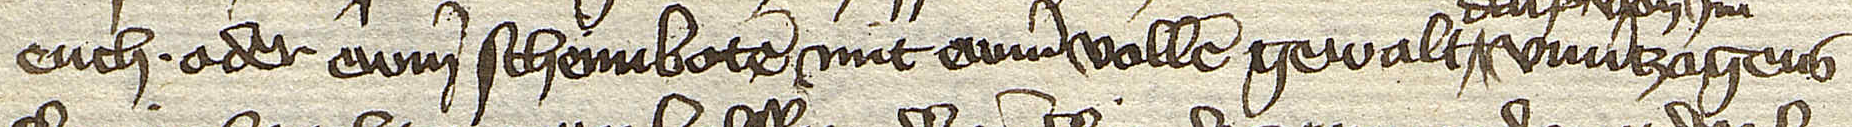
euch . oder ewm* ſcheimbote* mit ewm* volle* gewalt vnu*cʒogens
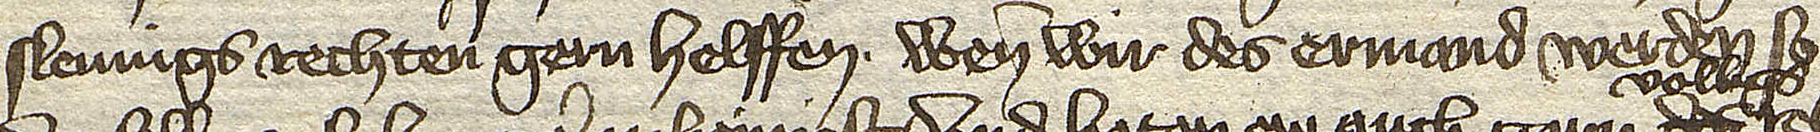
ſleunigs rechten gern helffen . wen* wir des ermand werden ſo
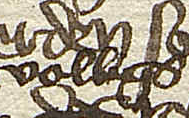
volligs
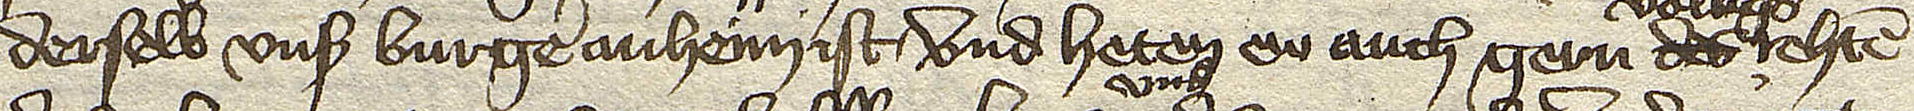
derſelb vnſ* burge* anheim iſt / Vnd heten ew auch gern des rehte*
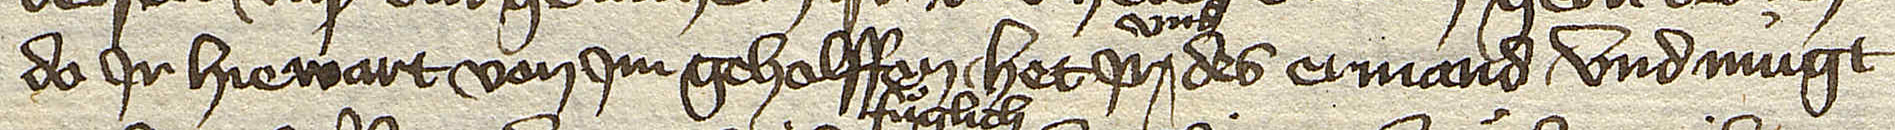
do Ir hie wart von Im geholffen / het Ir des ermand / Vnd mügt
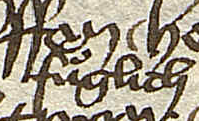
füglich
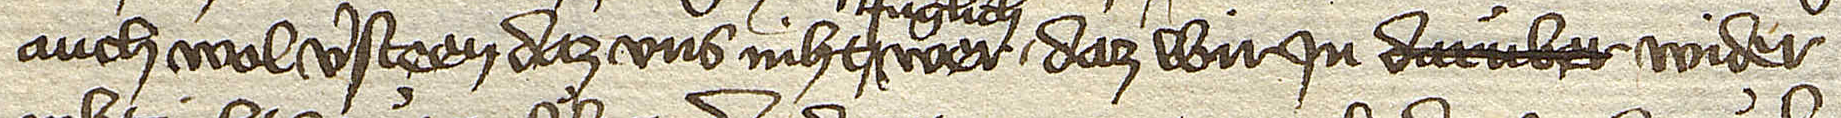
auch wol v*ſteen daʒ vns niht wer / daʒ wir In darüber wider
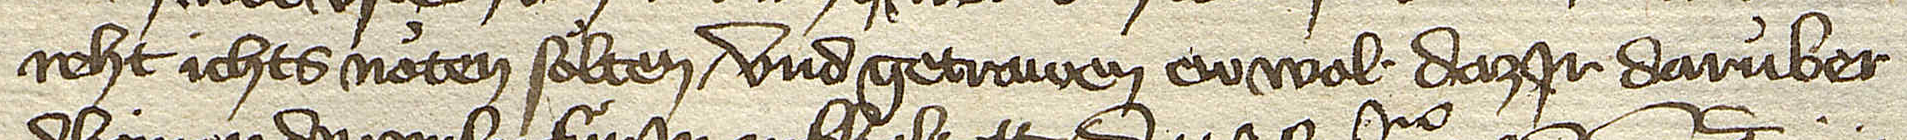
reht ichts nöten ſölten / Vnd getrawen ew wol . daʒ Ir darüber
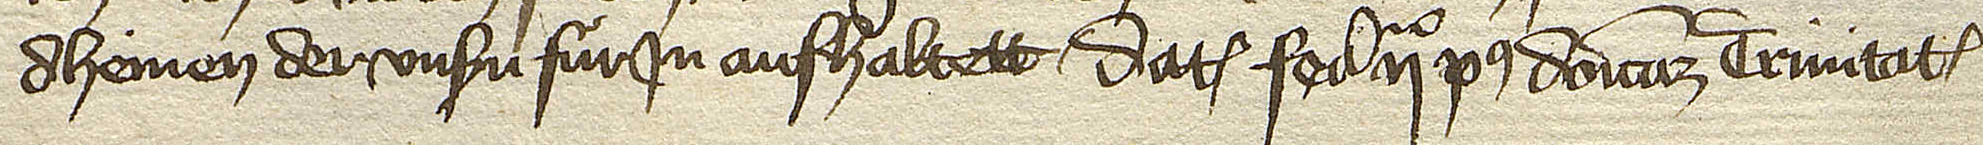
dheinen der vnſ*n für In aufhaltett / Dat* fea* ii* p* doi*ca* Trinitat*
